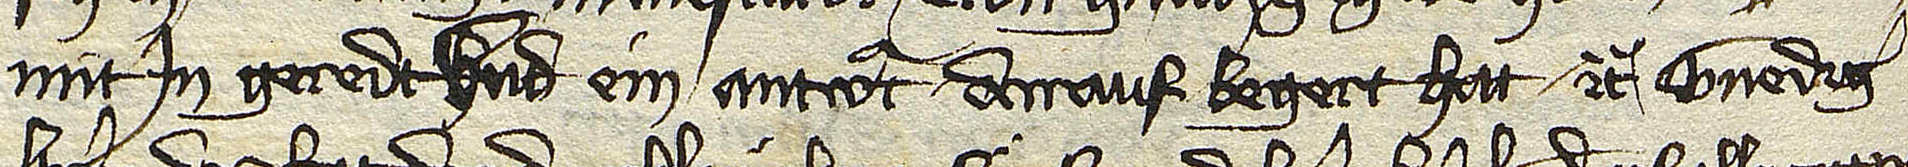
mit In geredt Vnd ein antw*t / darauf begert hat ec* Gnedig*
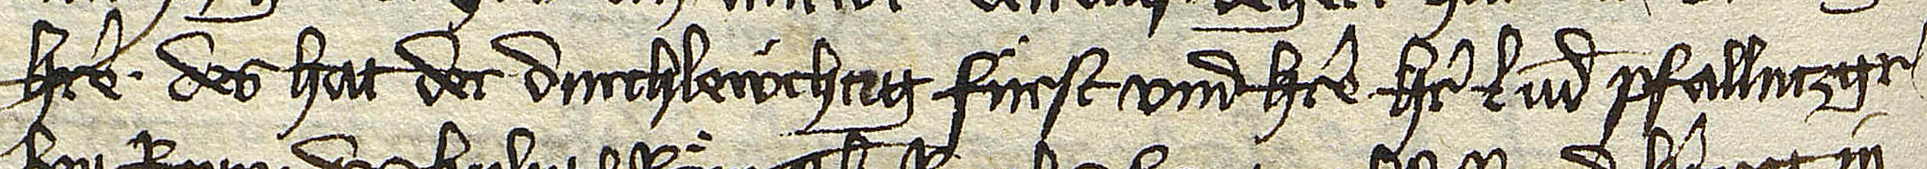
h*re . des hat der durchlewchtig fürſt und h*re hr* lud* pfallncʒgr*
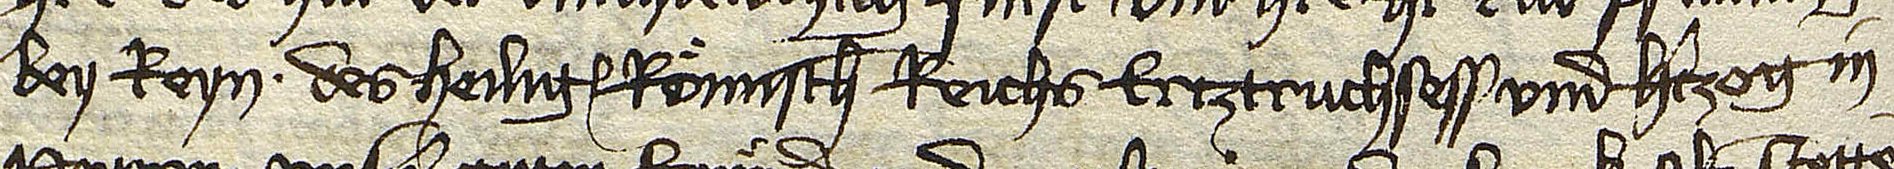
bey Reyn . des heilig* Römiſch* Reichs Ercʒtruchſeſſ vnd h*cʒog in
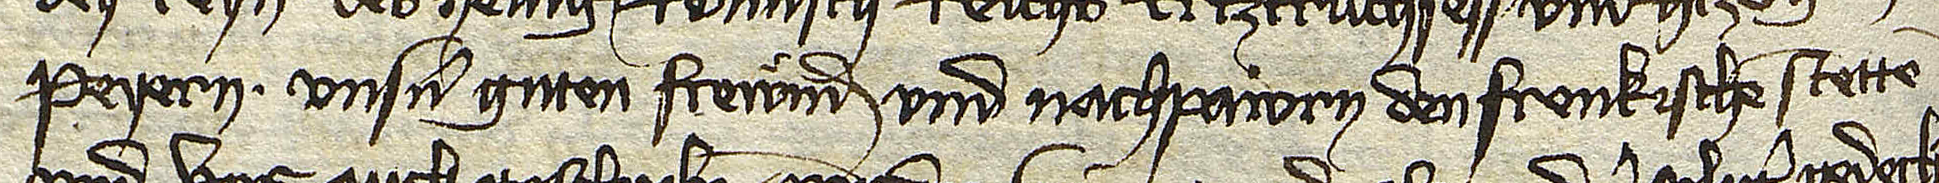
Peyern . vnſn* guten frewnd* vnd nachpawrn den frenkiſche* ſtette*
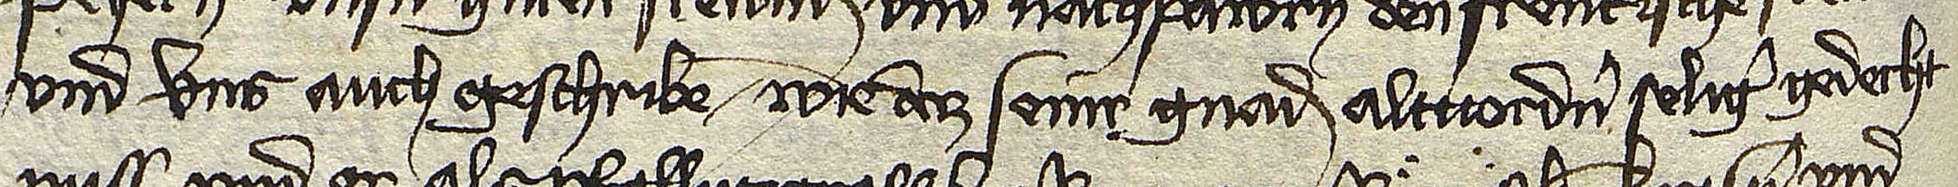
vnd vns auch geſchribe* / wie daʒ ſeinr gnad* altuordn* ſelig* gedecht
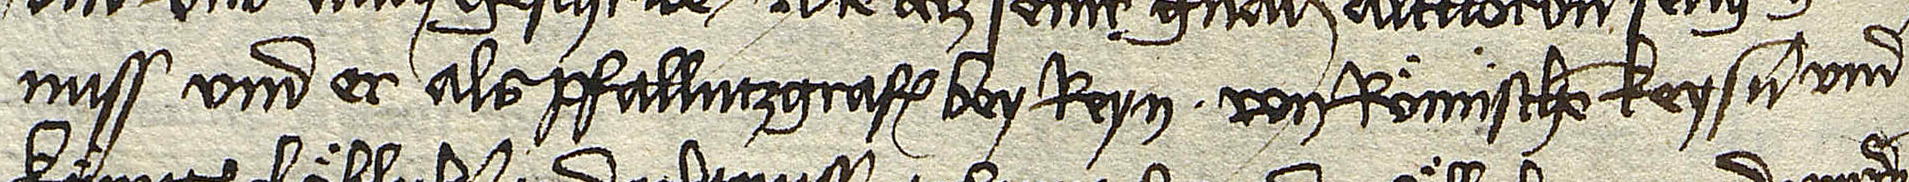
nuſſ vnd er als pfallncʒgraf* bey Reyn . von Römiſche* keyſ*n vnd
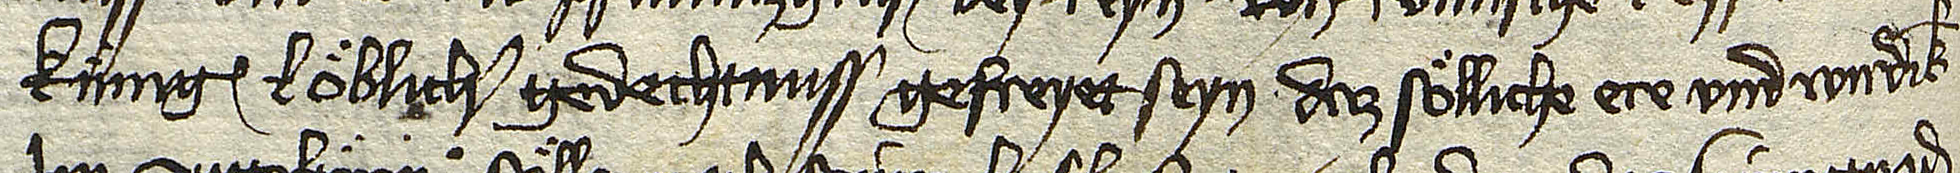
künig* löblich* gedechtnuſſ gefreyet ſeyn daʒ ſölliche ere vnd wirdik*
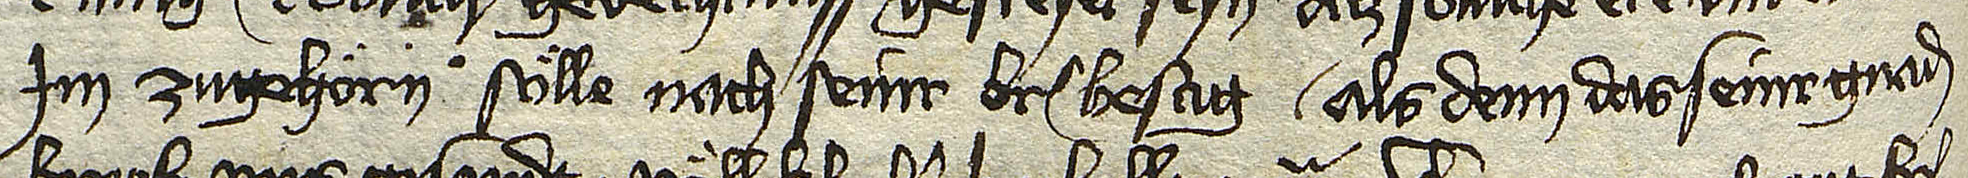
Im ʒugehörn ſölle nach ſeinr br* beſag / als denn das ſeinr gnad*
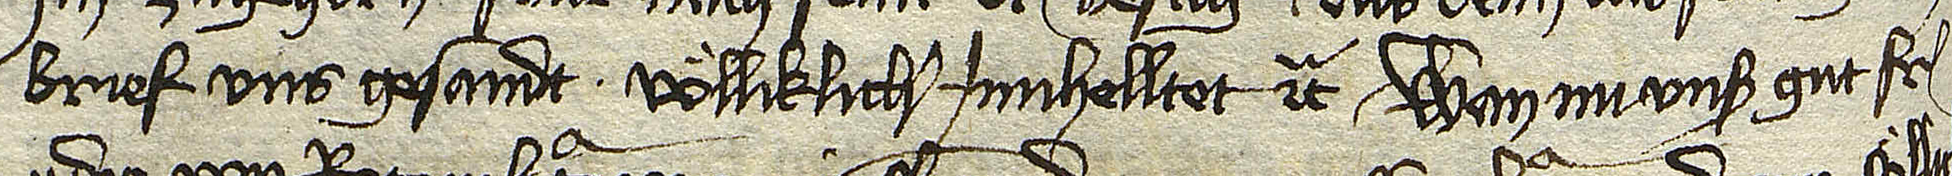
brief vns geſandt . völliklich* Innhelltet ec* / Wan nu vnſ* gut fr*
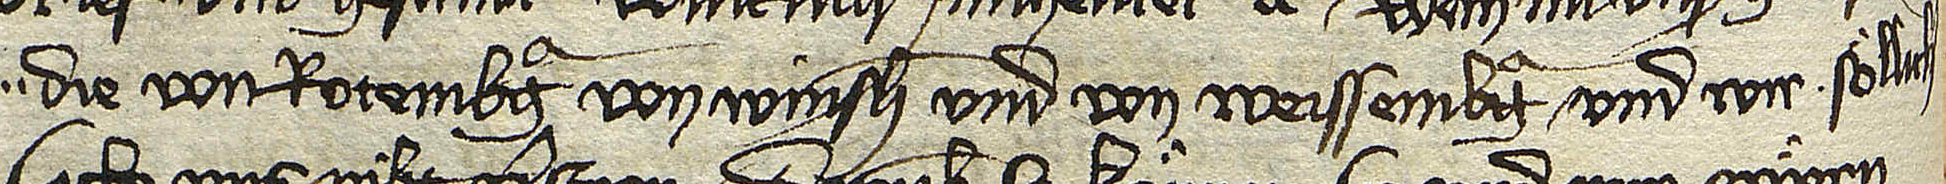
~ die von Rotemb*g von winſh* vnd von Weiſſemb*g vnd wir . ſöllich
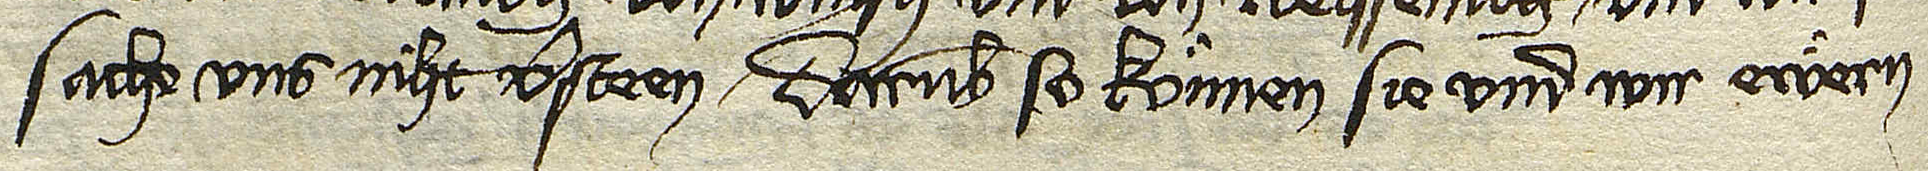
ſache vns niht v*ſteen / Daru*b ſo können ſie vnd wir ewern
